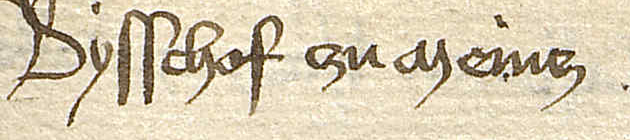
Byſſchof cʒu Meincʒ
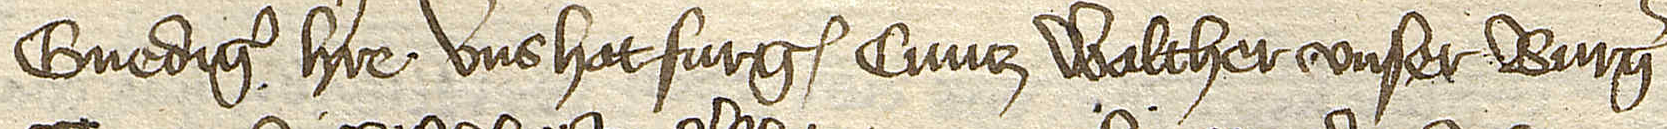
Gnedig* h*re . Vns hat furg* Cuncʒ Walther vnſer Burg*
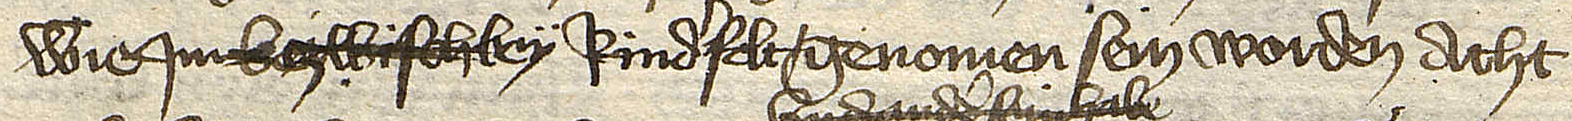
wie Im bey ʒwiſch bey Rind*felt / genomen ſein worden Acht
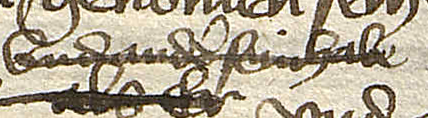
vnd ande* ſein habe
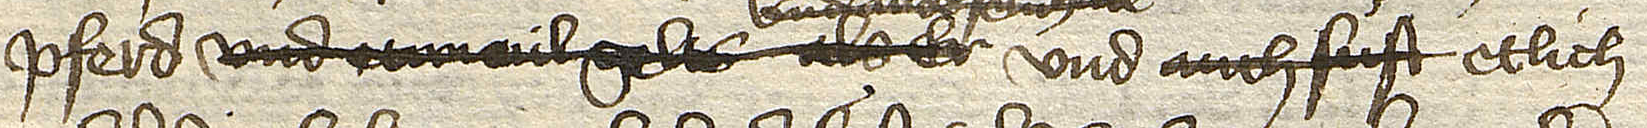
pferd vnd etwieuil gelts als Er vnd auch ſüſt etlich
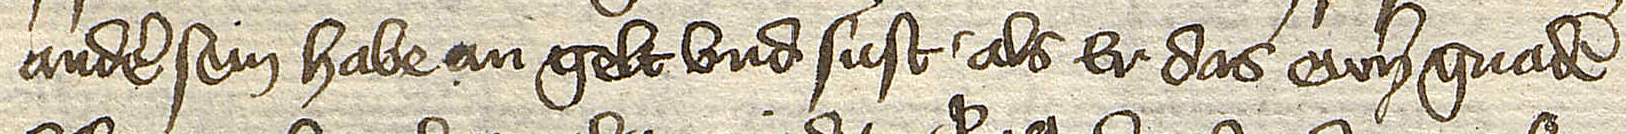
ande* ſein habe an gelt vnd ſüſt / als Er das ewn* gnade*
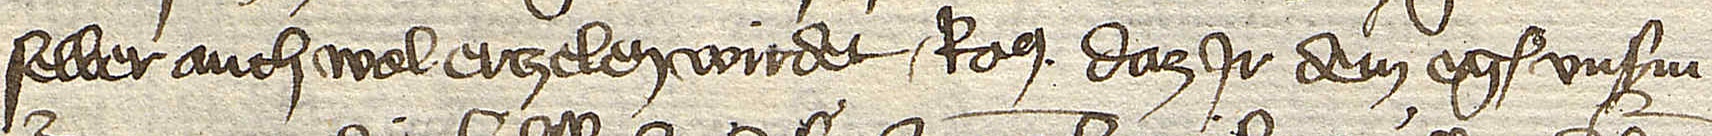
ſelber auch wol ercʒelen wirdet / Ro* . daʒ Ir dem eg* vnſ*m
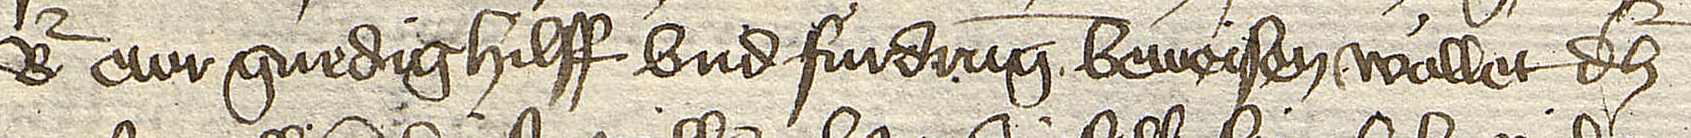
B* ewr gnedighilff vnd fürdru*g beweiſen wöllet dh*
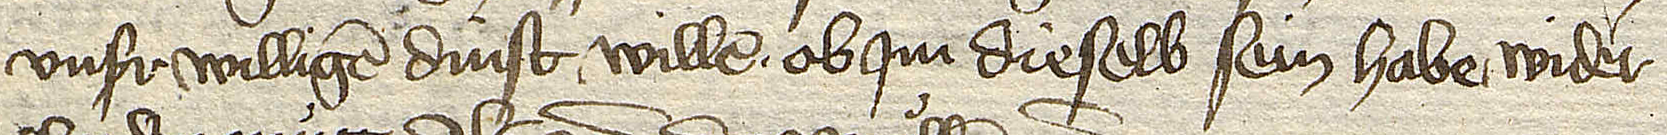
vnſ*r willige* dinſt wille* . ob Im dieſelb ſein habe wider
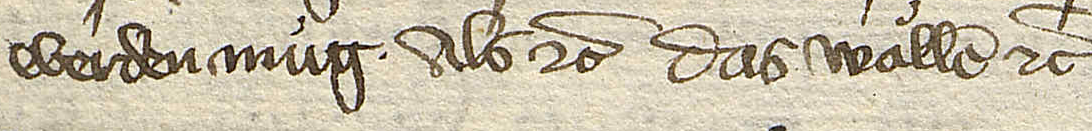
werden müg . Als ec* Das wölle* ec*
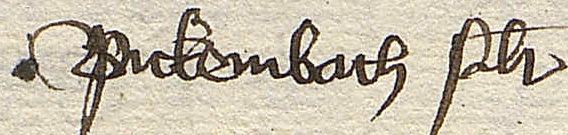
Pickembach ſilr*
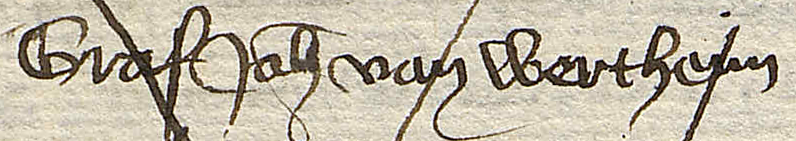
Graf Ioh* von Wertheim
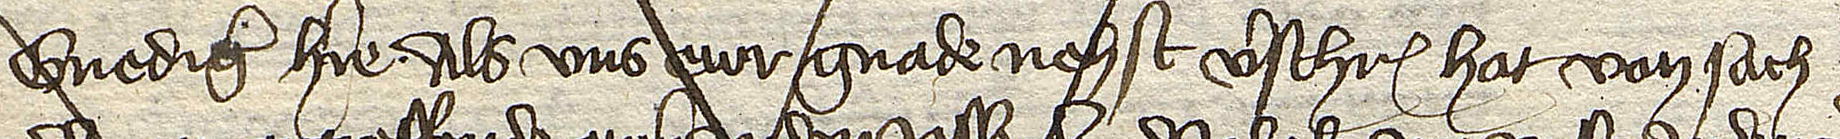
Gnedig* h*re . Als vns ewr gnade nehſt v*ſchr* hat von ſach
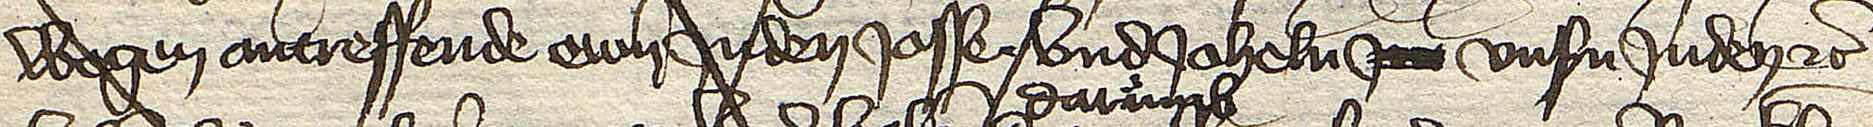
wegen antreffende ewn* In den Ioſſe . Vnd Ioheln Iu vnſ*n Iuden ec*
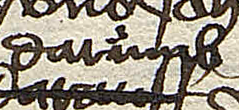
darümb
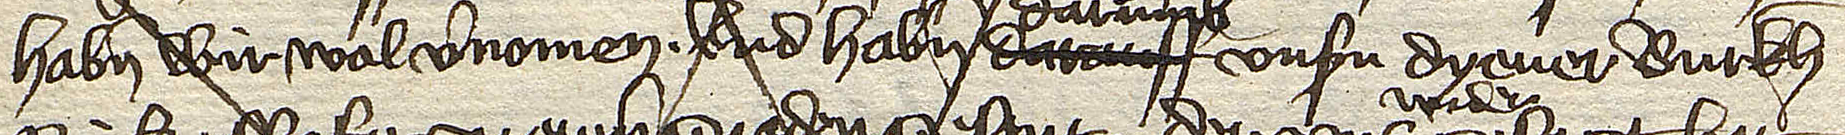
habn* wir wol v*nomen . Vnd habn* darauff vnſ*n dyener Burkh*
